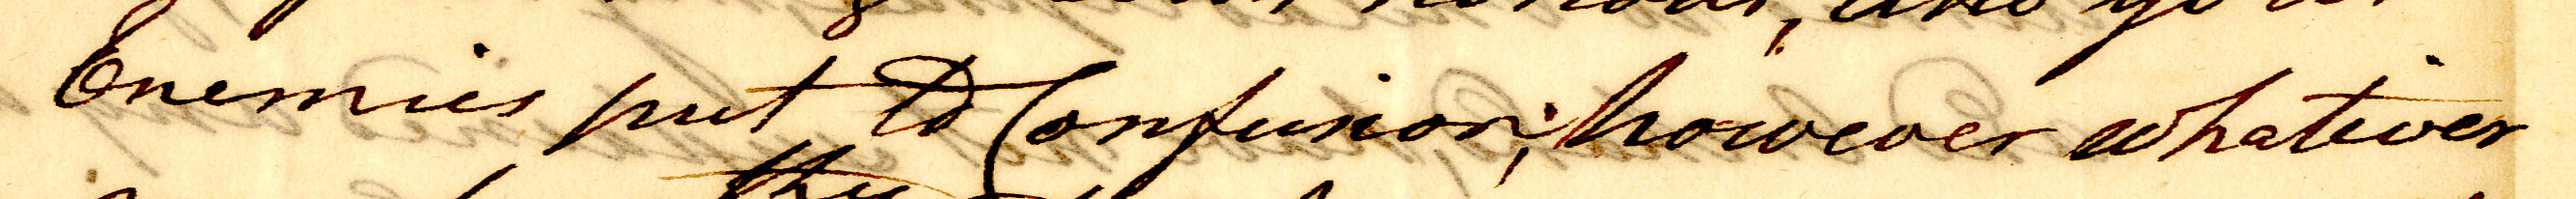Enemies put to Confusion; however whatever
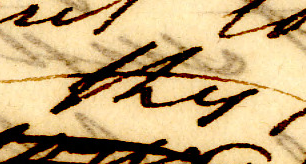thy
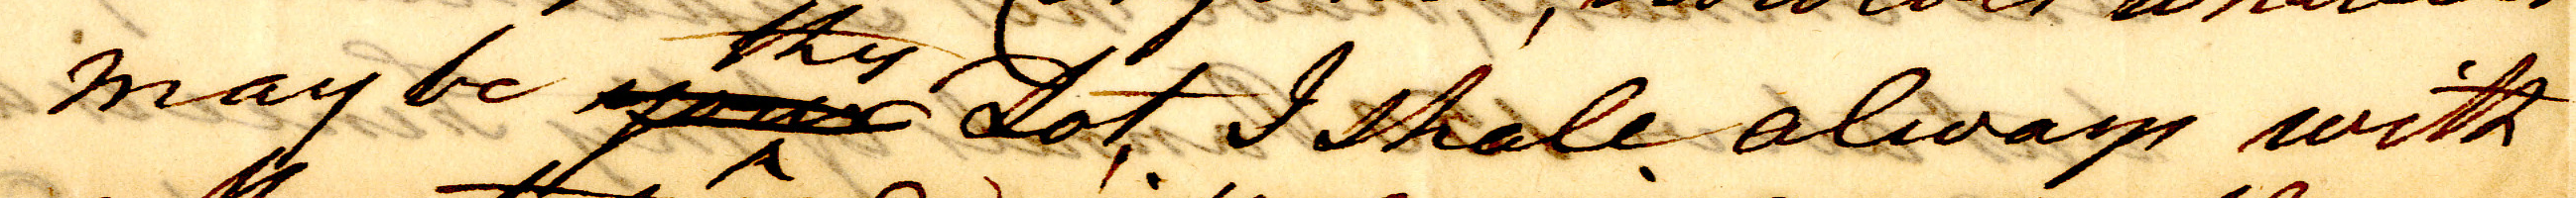may be ^ [your] Lot, I shall always with
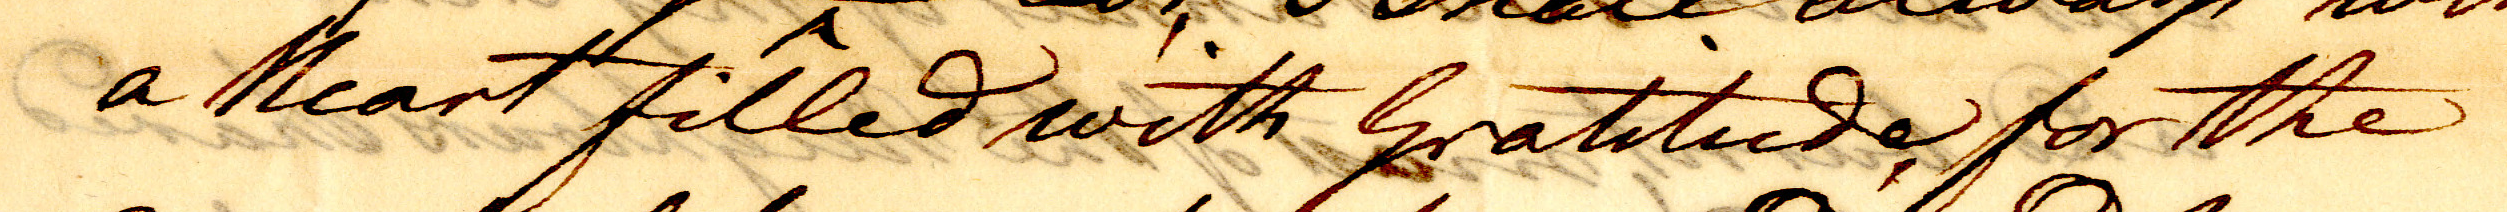a Heart filled with Gratitude for the
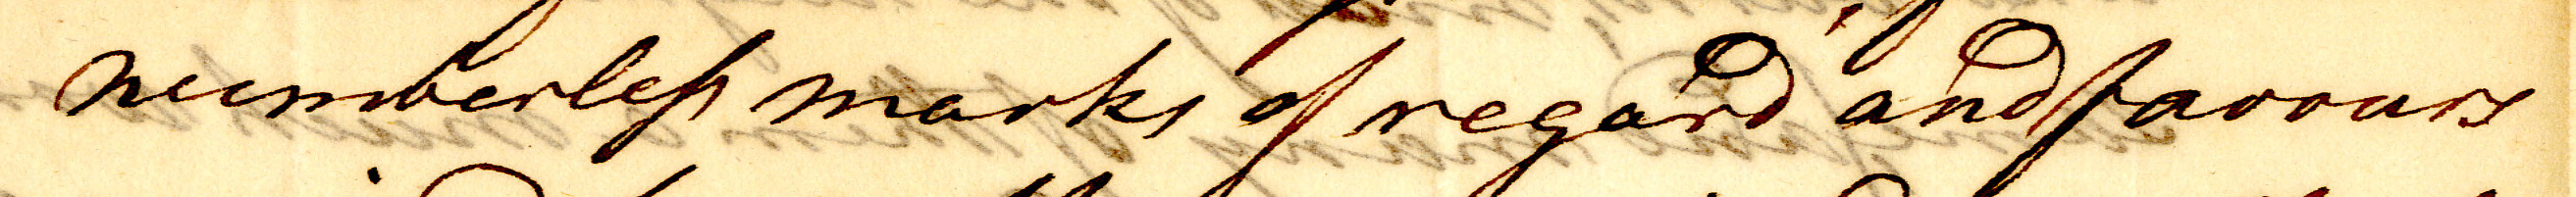numberless marks of regard and favours
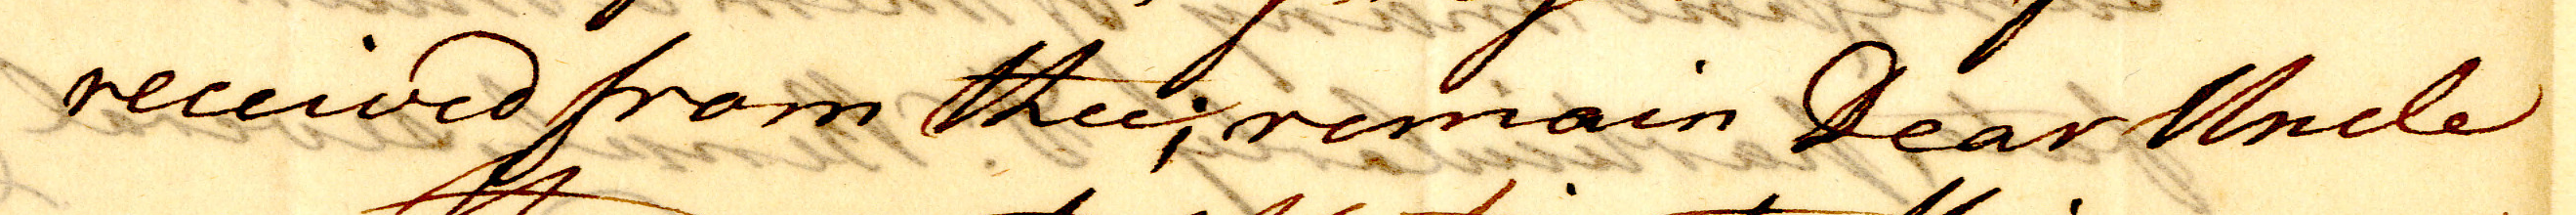received from thee; remain Dear Uncle
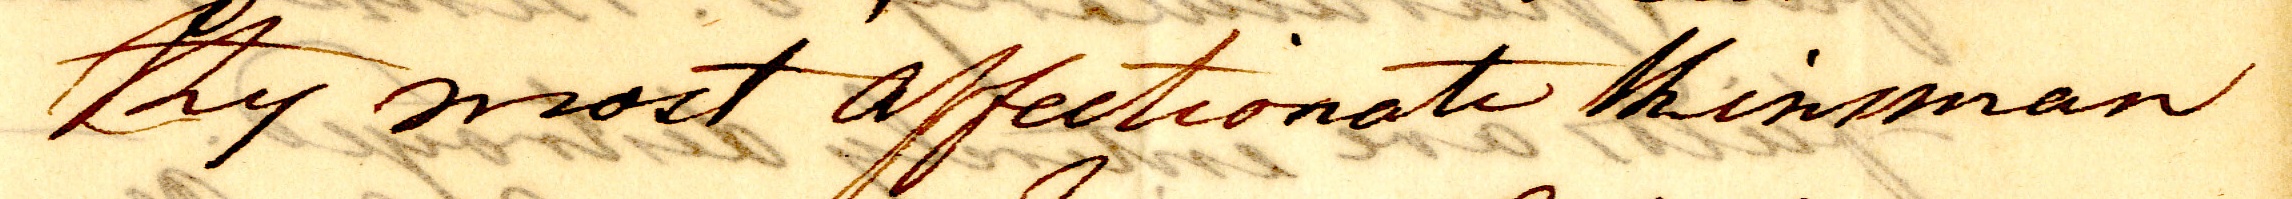thy most affectionate Kinsman
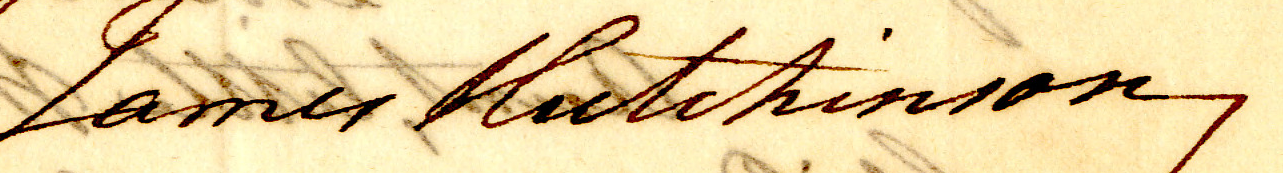James Hutchinson
